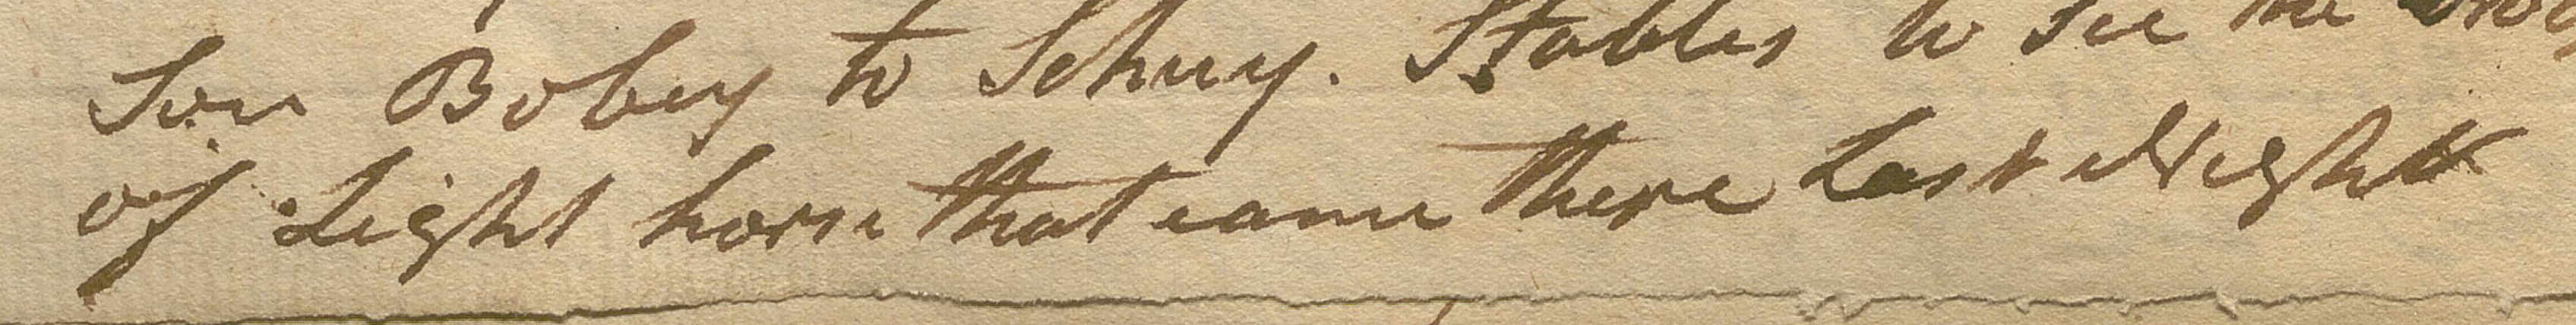of Light horse that came there Last Night
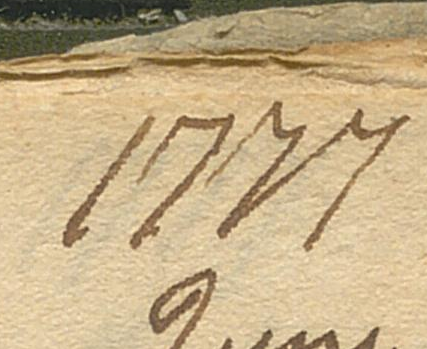1777
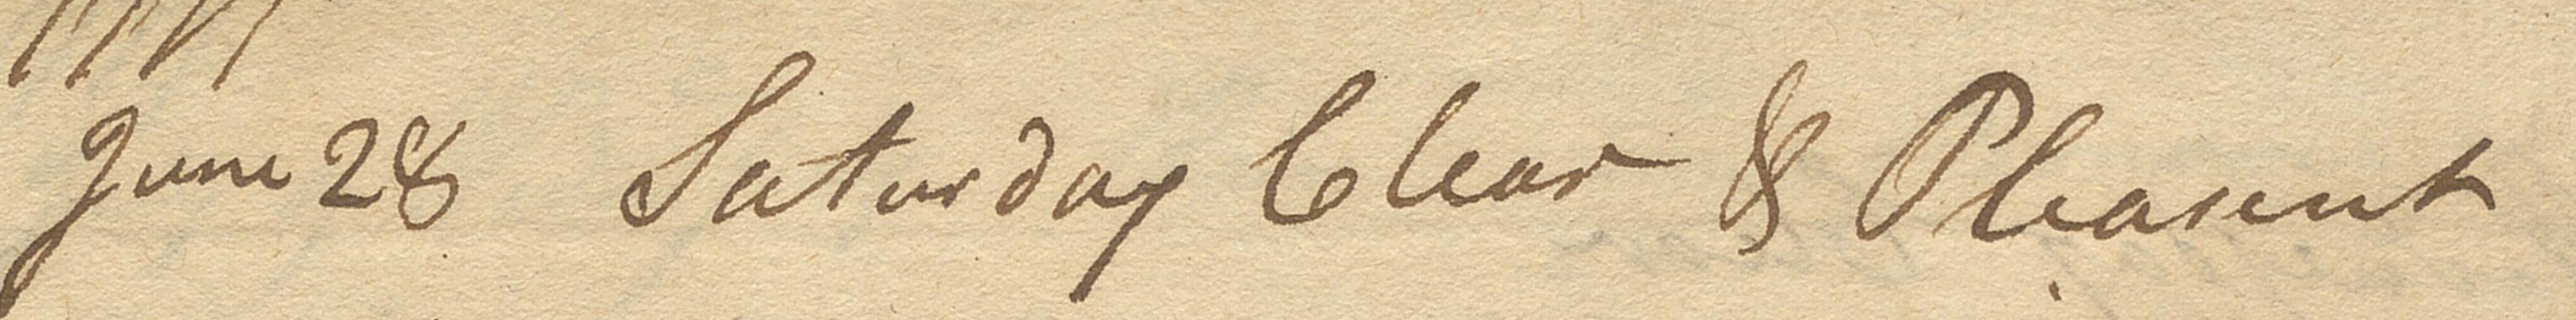June 28 Saturday Clear & Pleasent
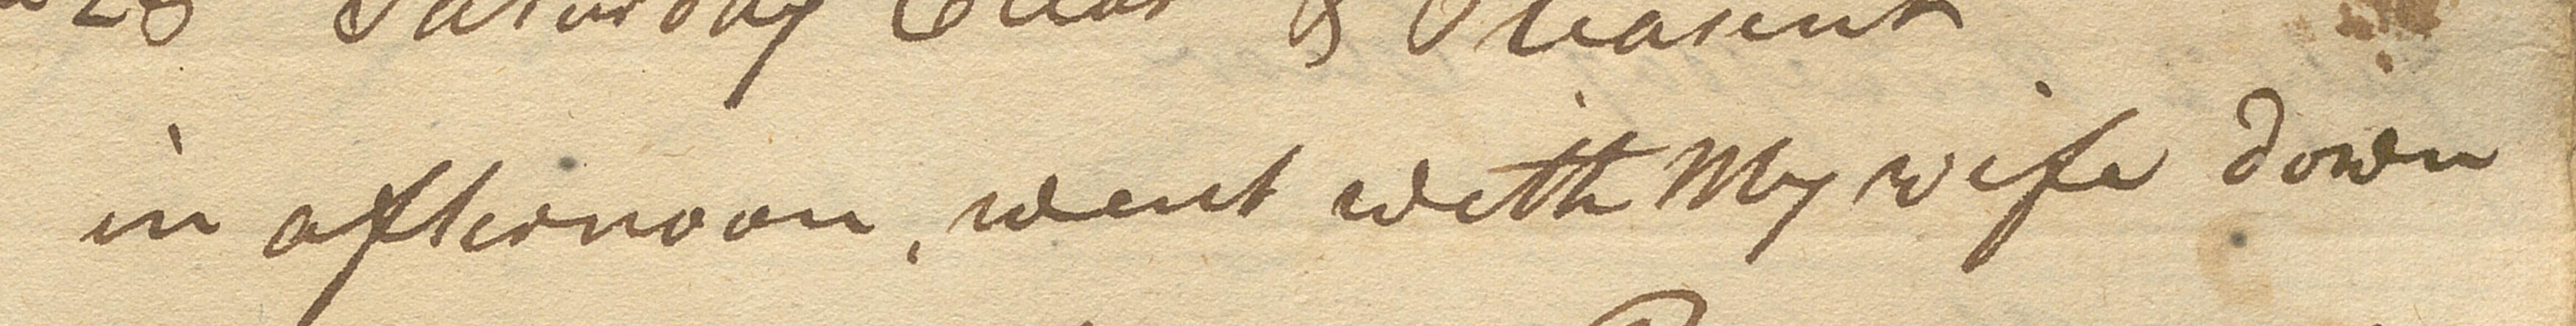in afternoon, went with My wife down
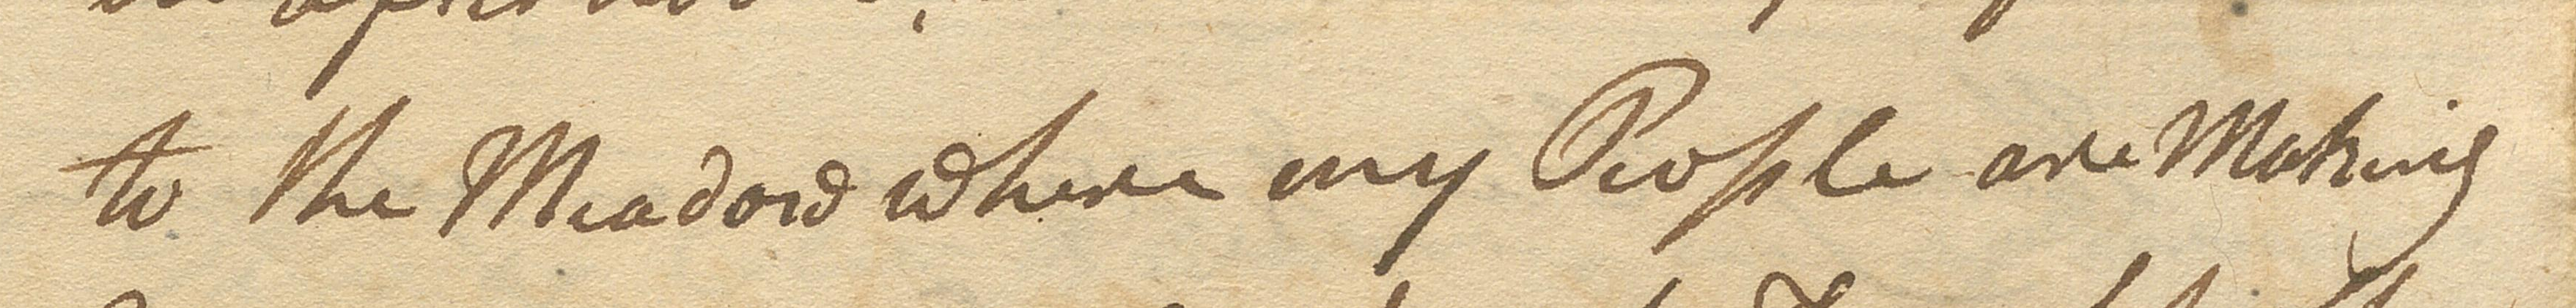to the Meadow where my People are Making
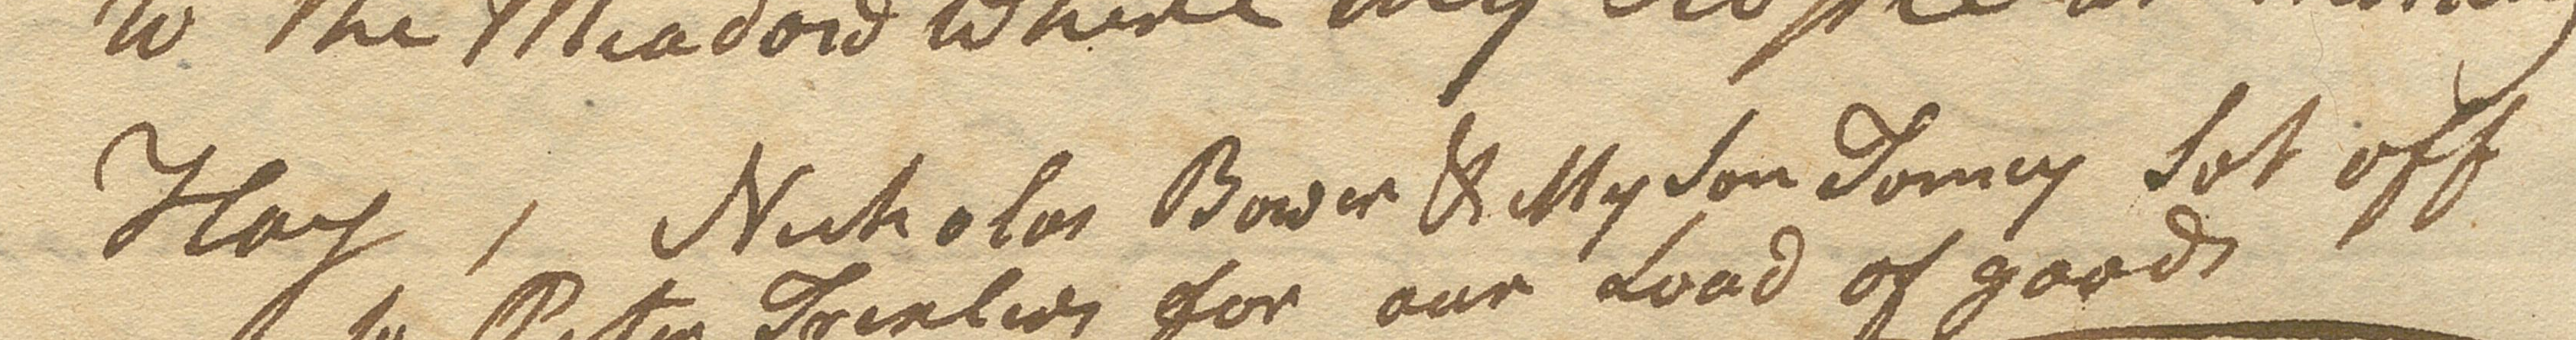Hay, Nicholas Bower & My Son Tomey Set off
